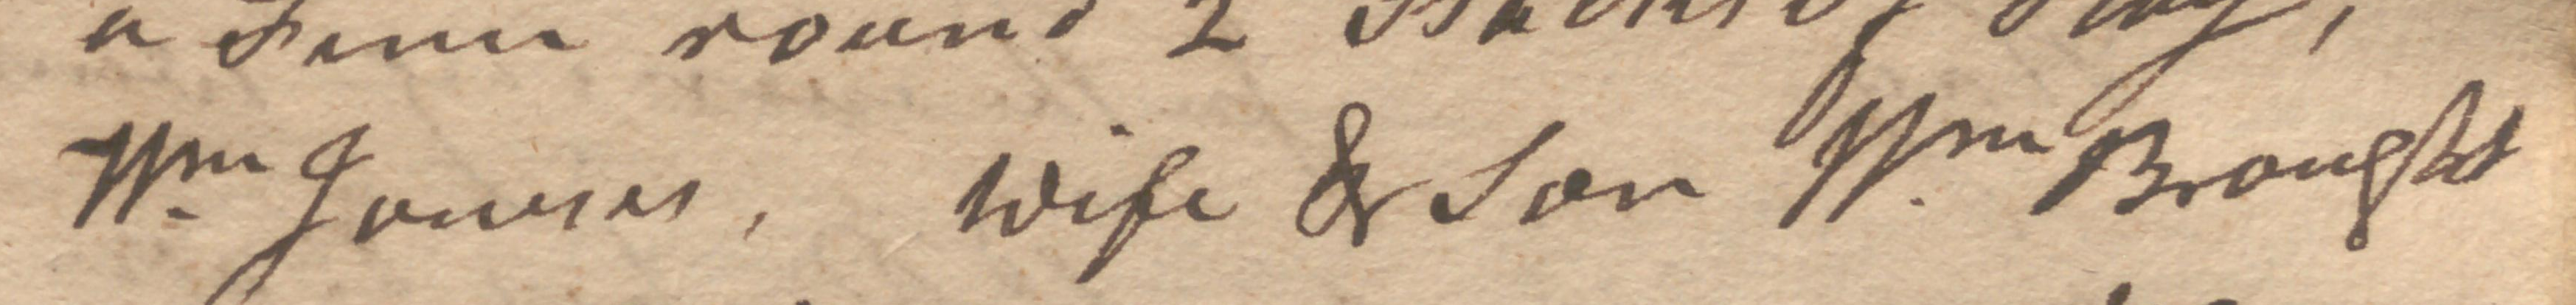W^m Joneses, wife & Son W^m. Brought
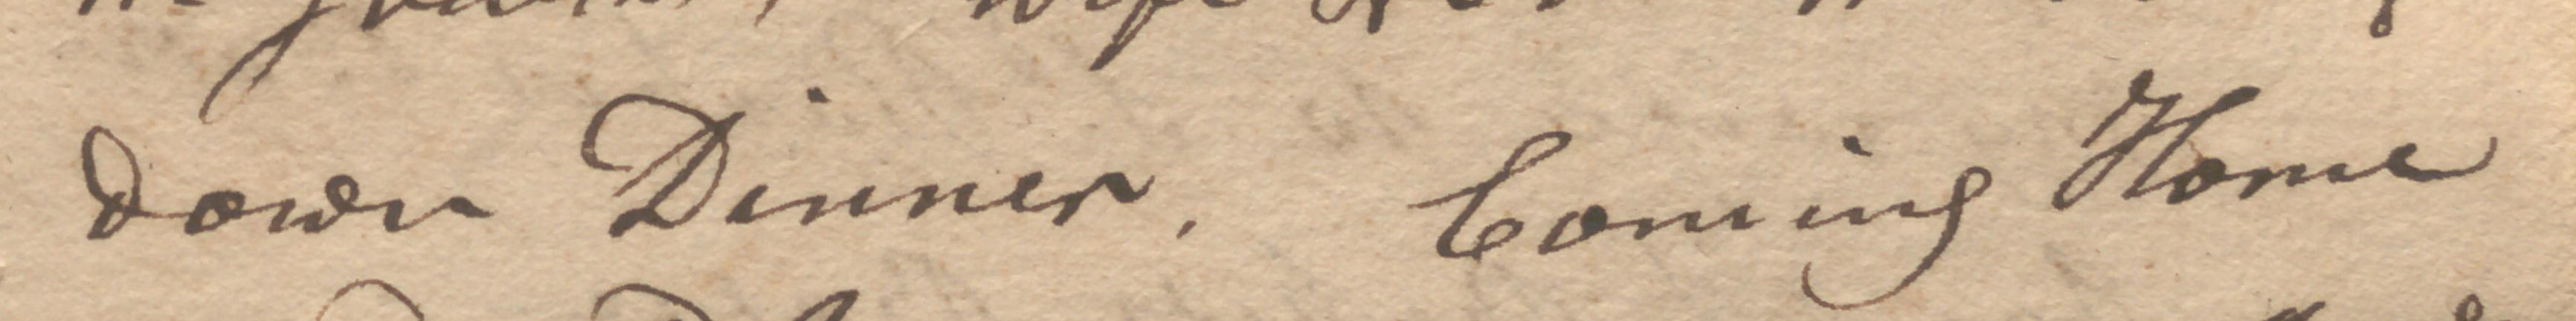down Dinner, Coming Home
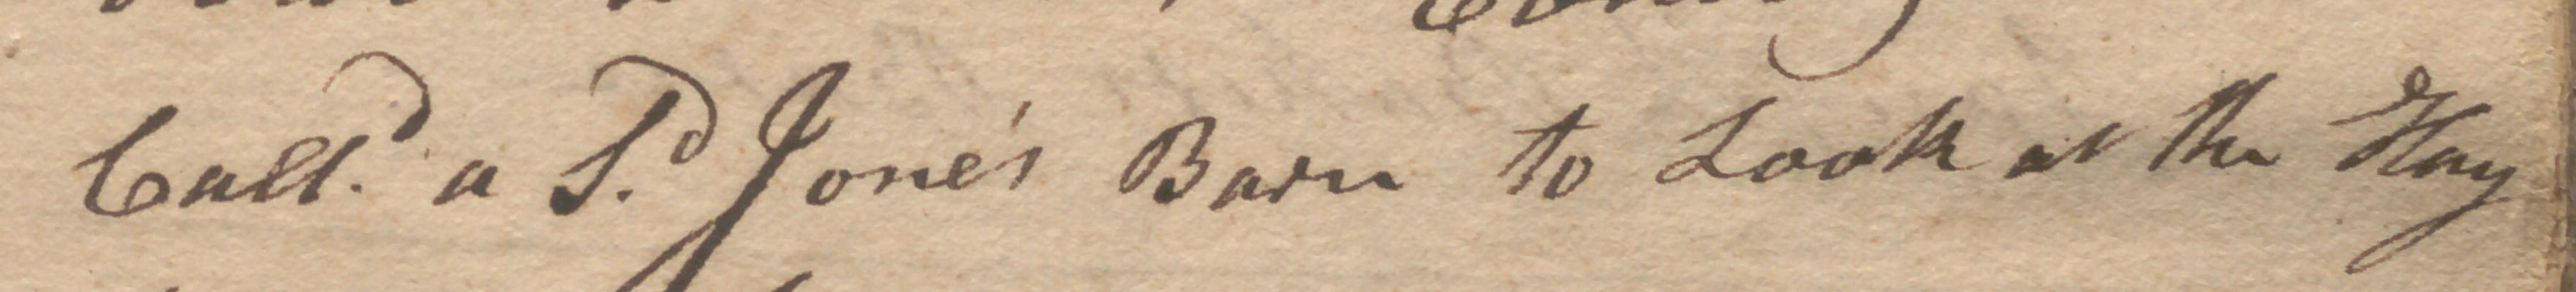Call^d. a s^d. Jone's Barn to Look at the Hay
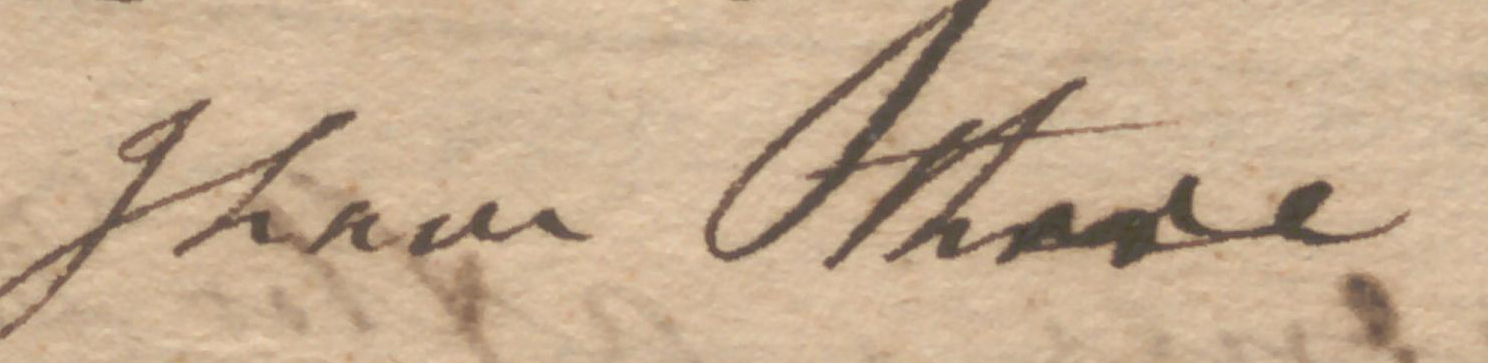I have there
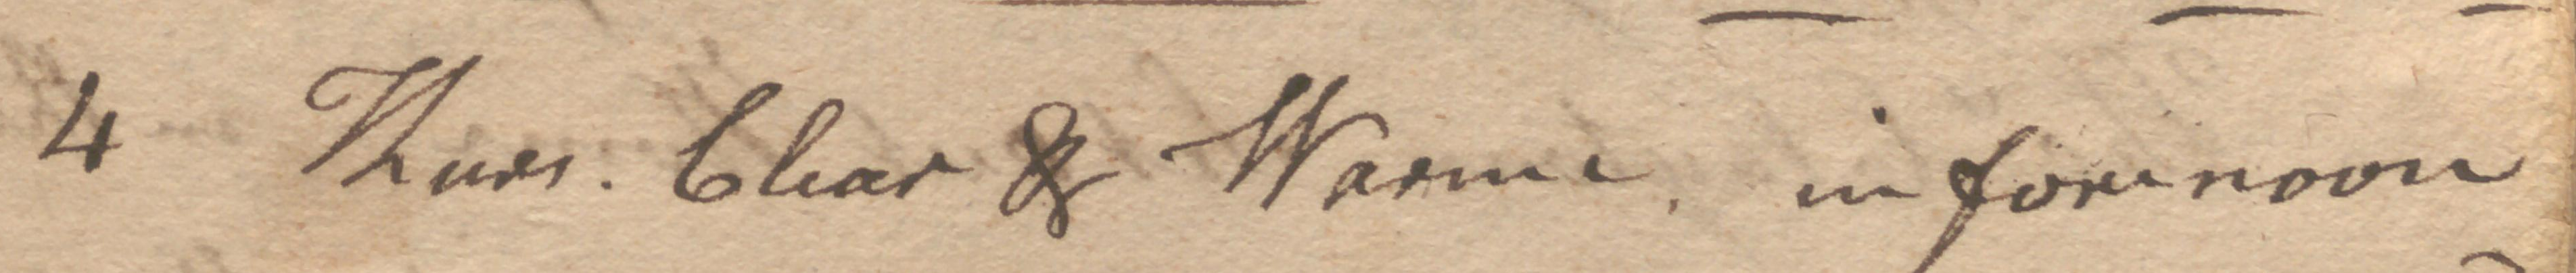4 Thurs. Clear & Warme, in forenoon
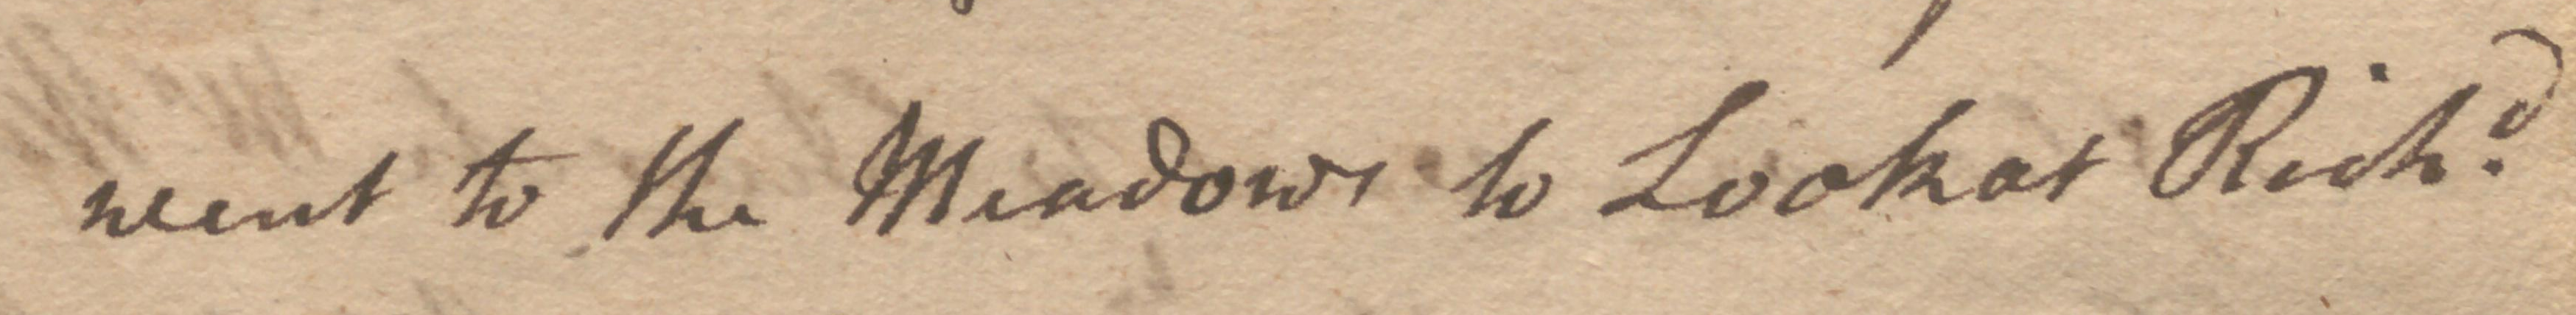went to the Meadows to Look at Rich^d.
